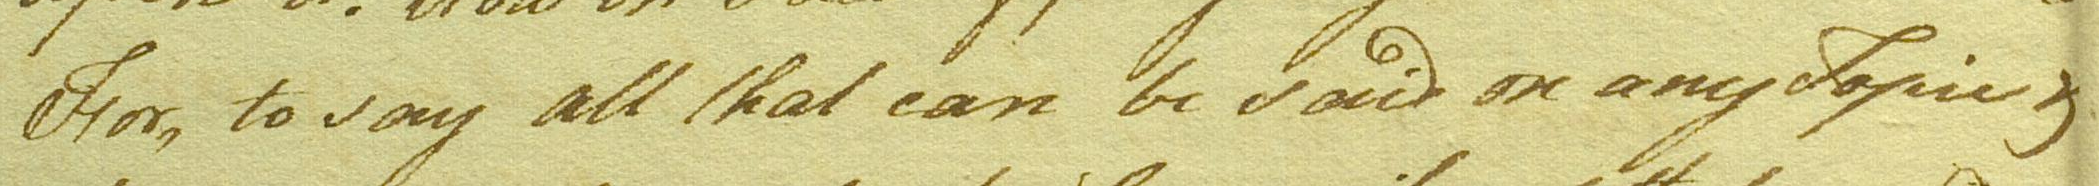For, to say all that can be said on any Topic &
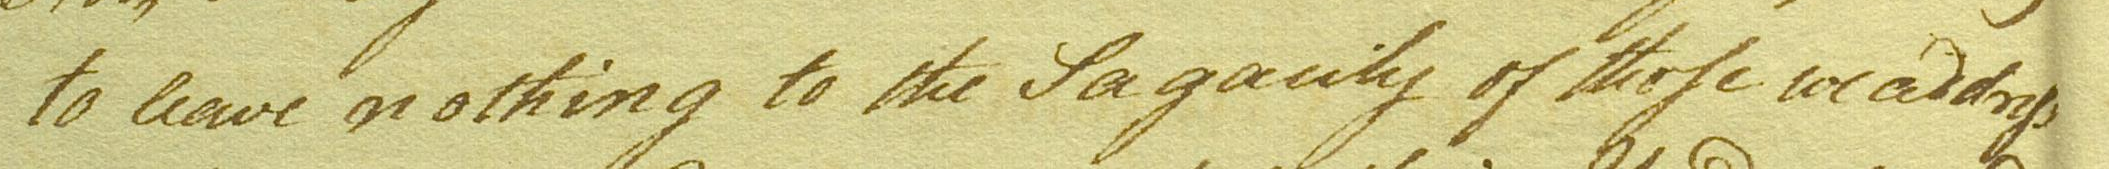to leave nothing to the Sagacity of those we address
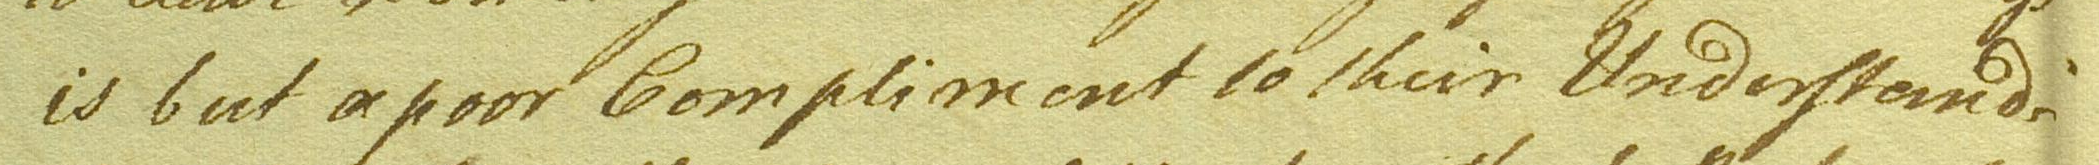is but a poor Compliment to their Understand-
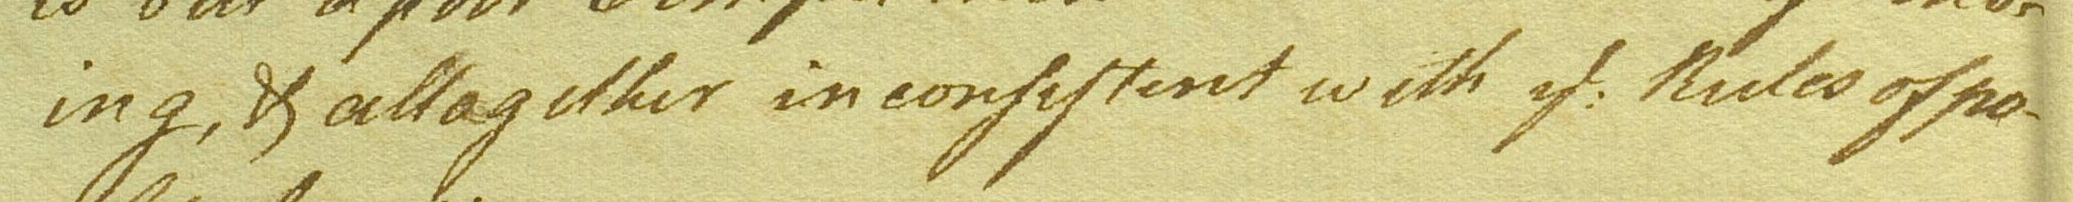-ing, & altogether inconsistent with y^e: Rules of po-
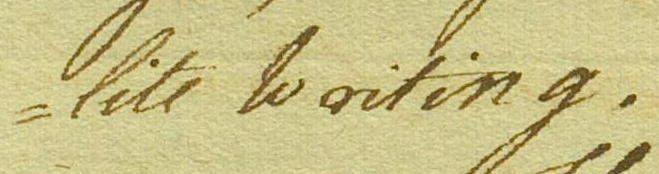-lite writing.
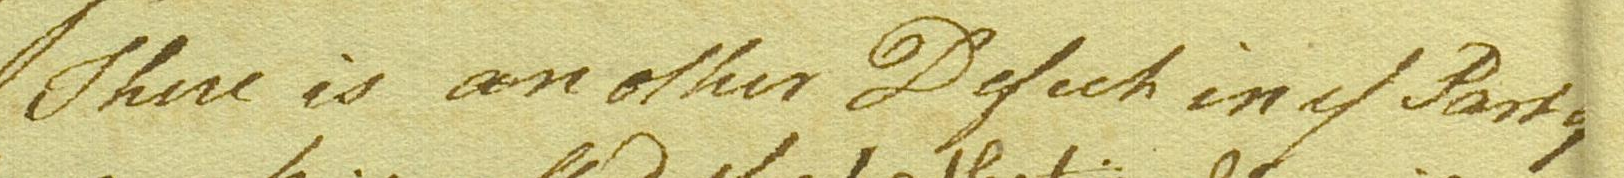There is another Defect in y^e Part of
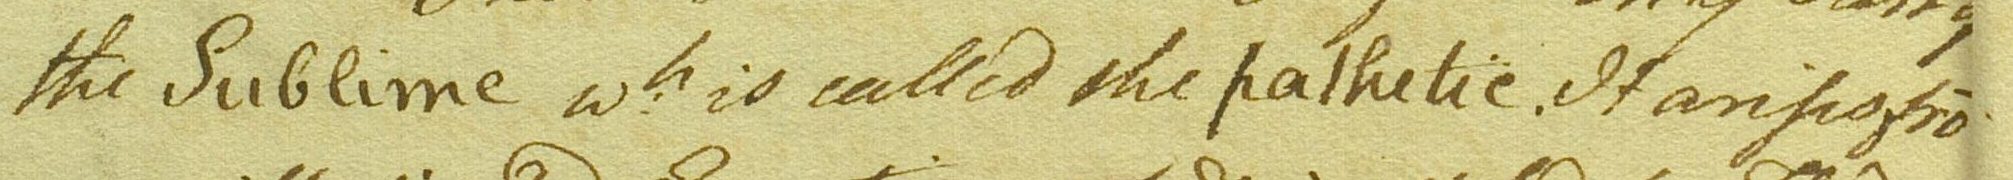the Sublime w^h is called the pathetic. It arises frō
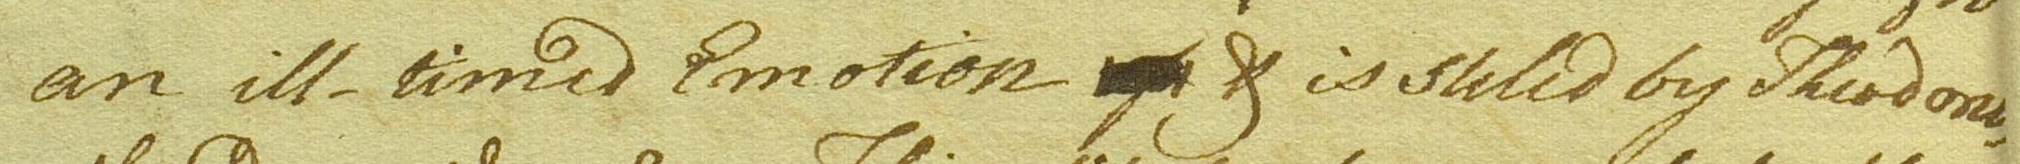an ill-timed Emotion [__] & is stiled by Theodoru
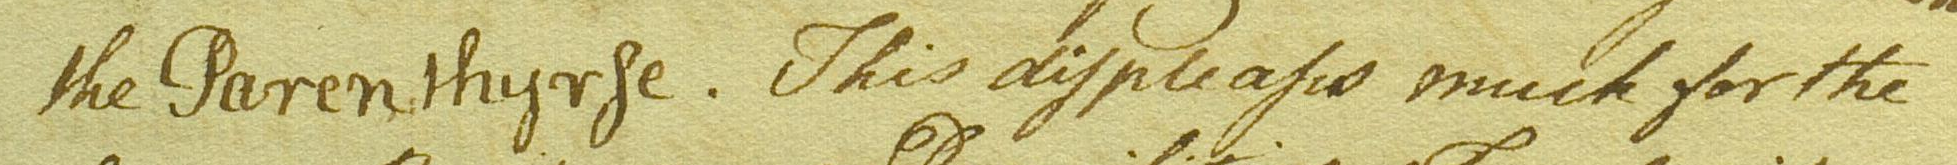the Parenthyrse. This displeases much for the
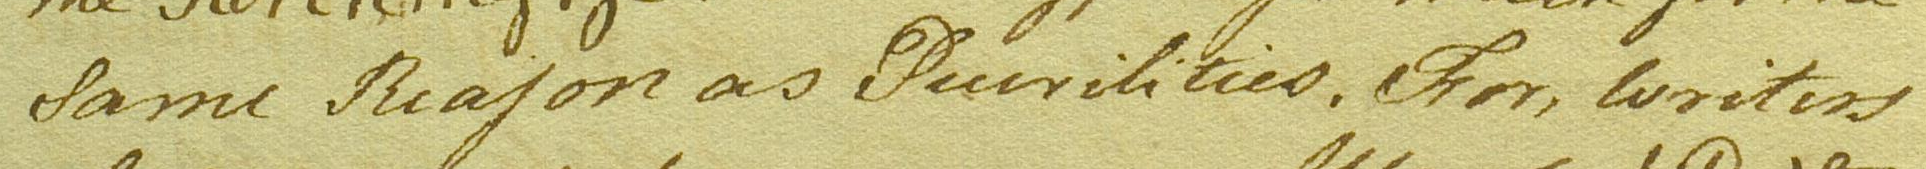same Reason as Puerilities. For, writers
